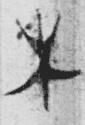木
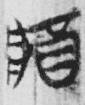𨟻（將）
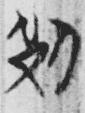死
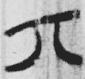亓（其）
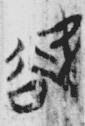欲
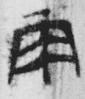雨
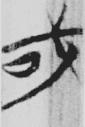或
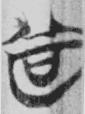甚
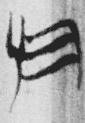於
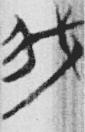我
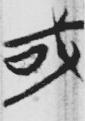或
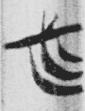必
